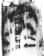遠
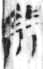○（夕）
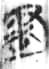○（建）
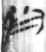於
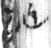卯
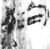於
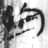於
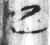巳
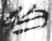於
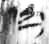於
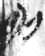申
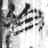於
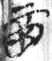梄（酉）
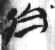於
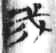戌
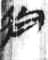於
